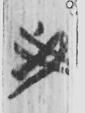我
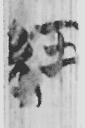紝
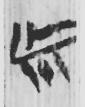巟
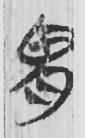胃
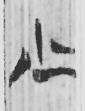少
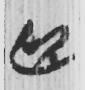臣
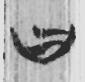曰
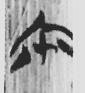尔
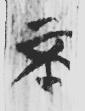不
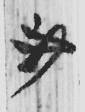我
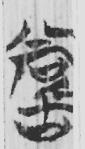嘗
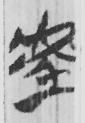𫊟（吾）
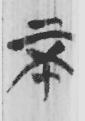不
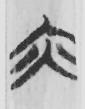亦
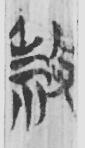殺
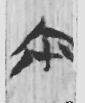尔
